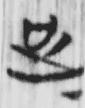足
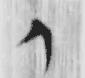人
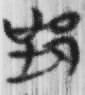郢
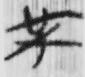某
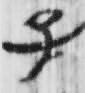子
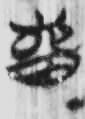留
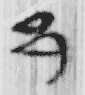邑
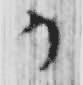人
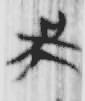吳
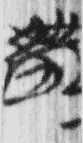○（勝）
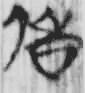俈
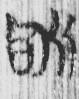斪
